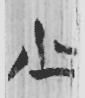少
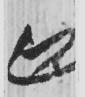臣
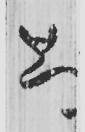也
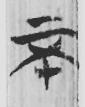不
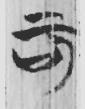可
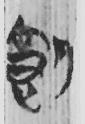飤
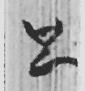也
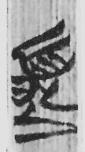{日止頁}（夏）
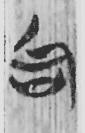句
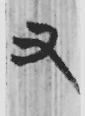又
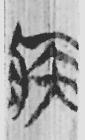疾
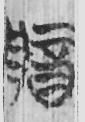𨟻（將）
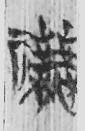{示艸無}
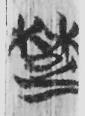楚
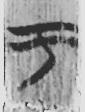于
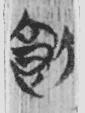飤
